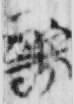○（舒）
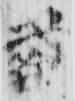戠
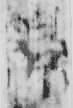歸
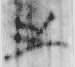之
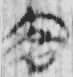客
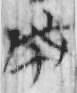成
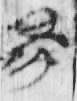昜（陽）
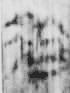○（卜）
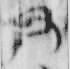尹
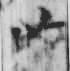成
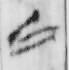㠯（以）
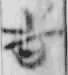告
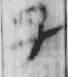子
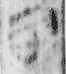司
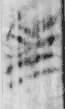馬
